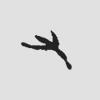又
